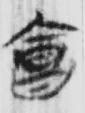會
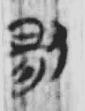傷
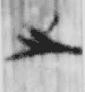之
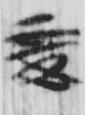妾
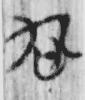叴
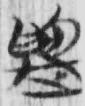○（舉）
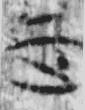正
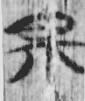{日亓}（期）
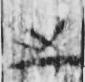之
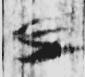旦
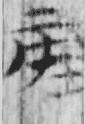坪
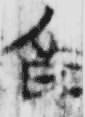爲
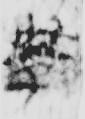李
